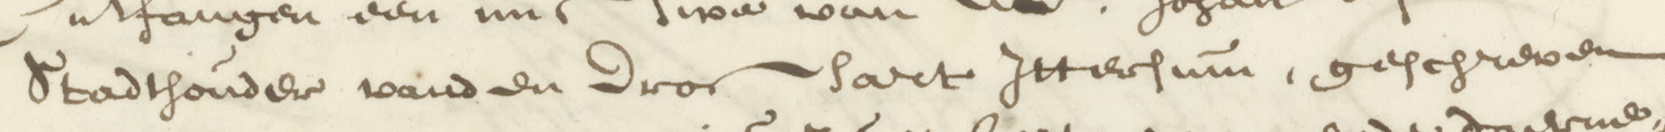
Stadthouder vanden Drossart Ittersum, geschreven
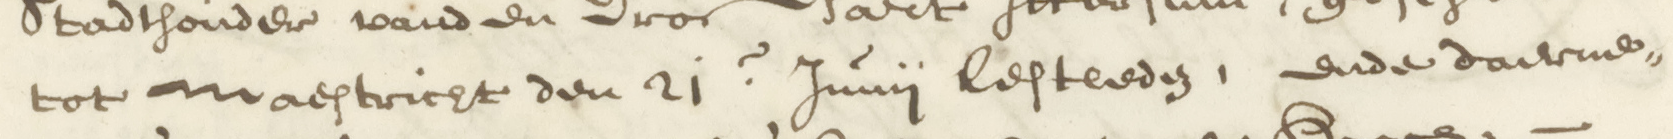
tot Maestricht den 21e Junij lestleden, ende daerne,,
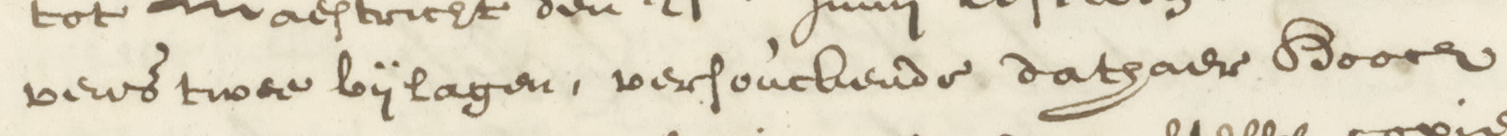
vens twee bijlagen, versouckende dat haer Hooch
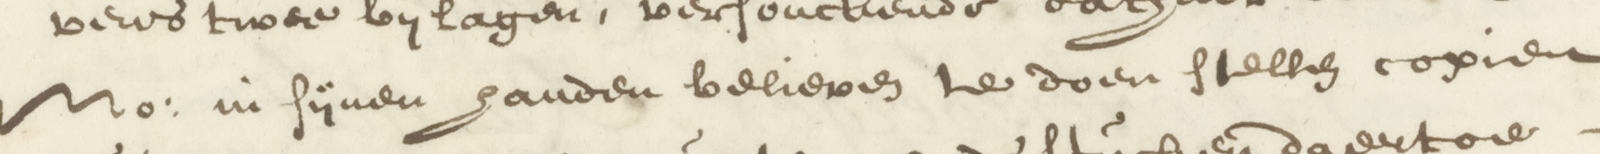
Mo: in sijnen handen believen te doen stellen copien
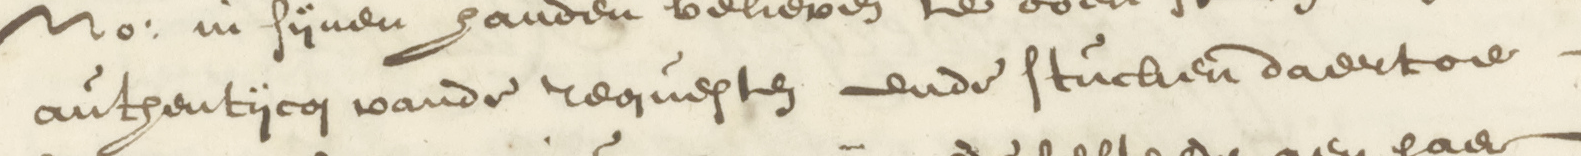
authentijcq vande requesten ende stucken daertoe
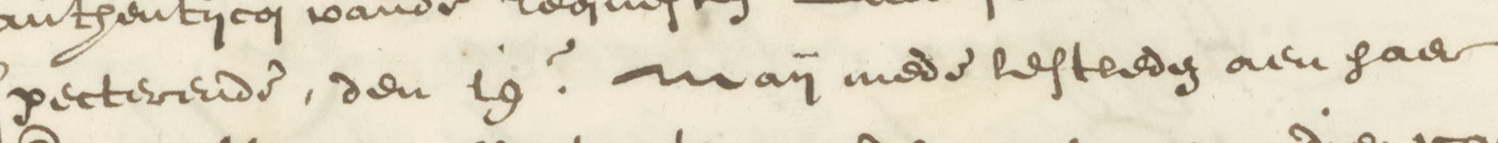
specterende, den 19e. Maij mede lestleden aen haer
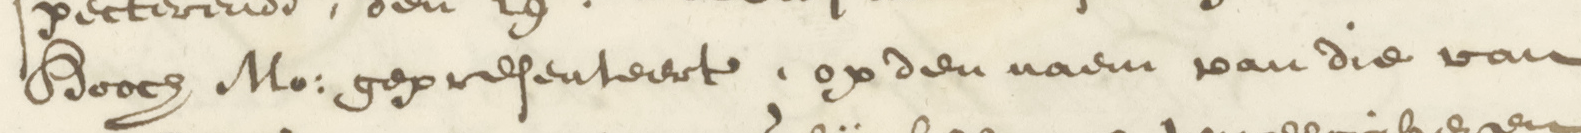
Hooch Mo: gepresenteert, op den naem van die van
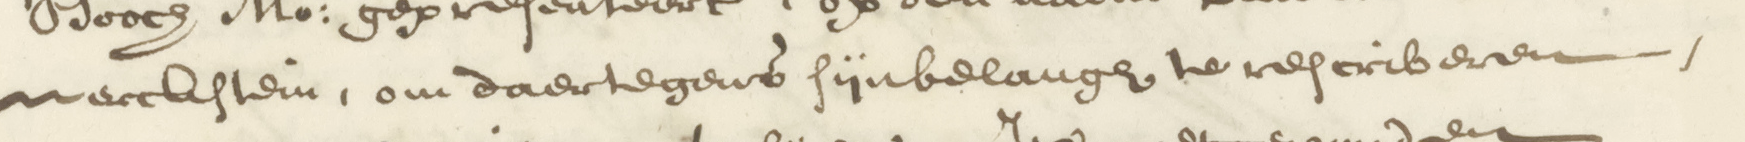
Merckstein, om daertegens sijn belangh te rescriberen,
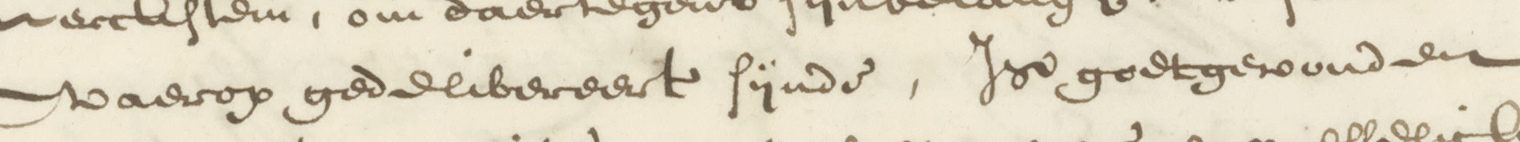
Waerop gedelibereert sijnde, Is goetgevonden
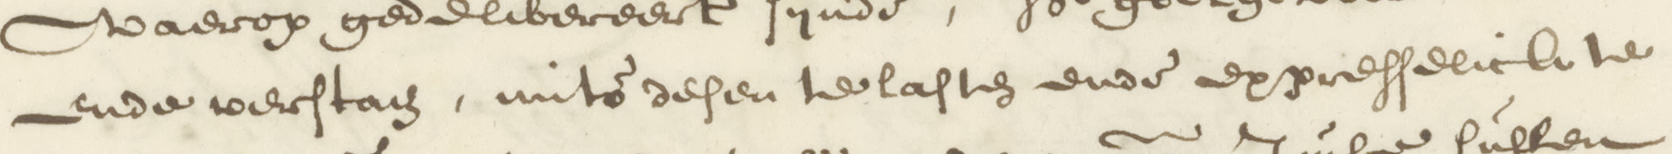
ende verstaen, mits desen te lasten ende expresselick te
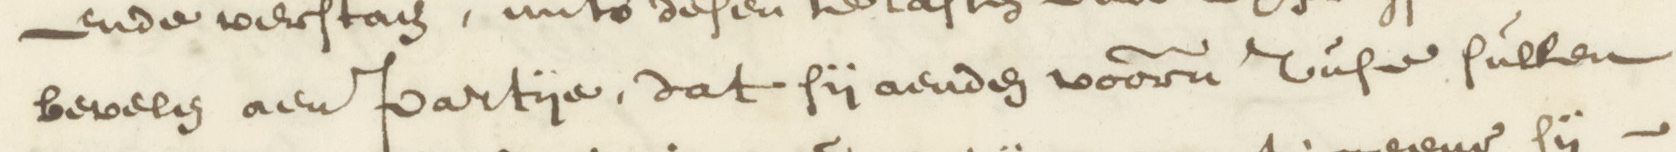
bevelen aen Partije, dat sij aenden voorn Ruse sullen
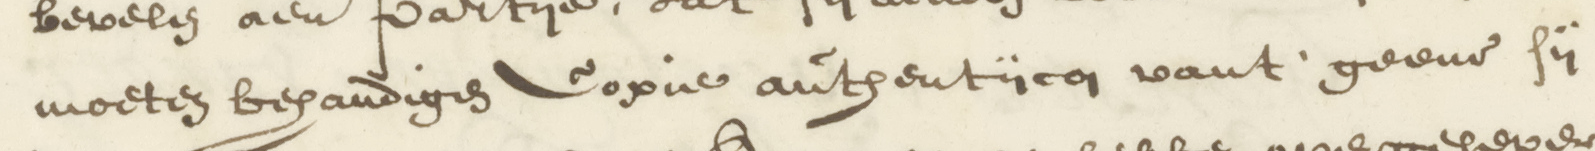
moeten behandigen Copie authentijcq vant' geene sij
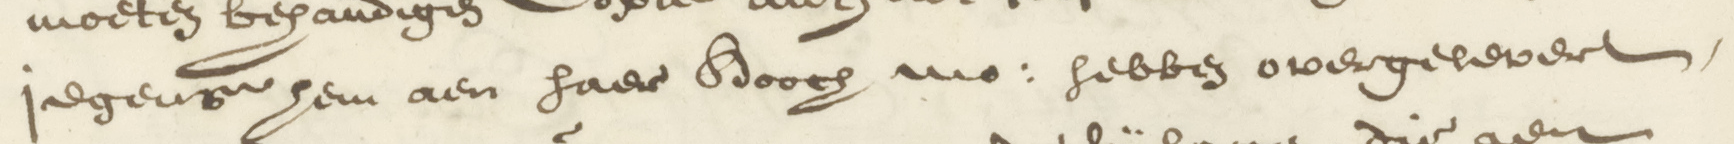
jegens hem aen haer Hooch mo: hebben overgelevert,
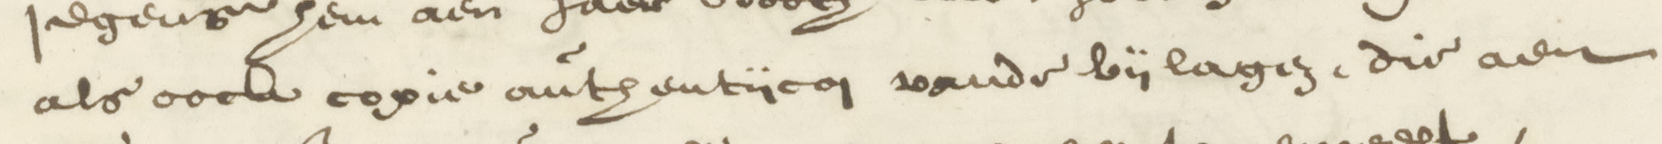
als oock copie authentijcq vande bijlagen, die aen
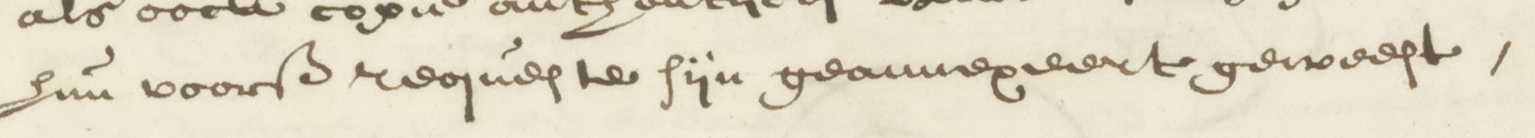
hun voors requeste sijn geannexeert geweest.
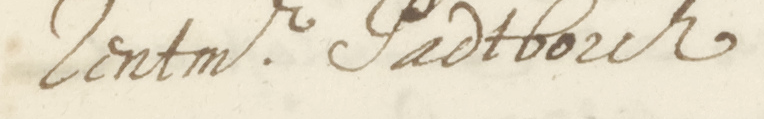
Rentmr. Padtborch
